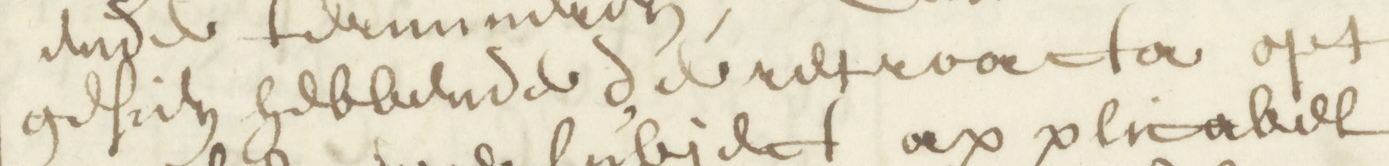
gesien hebbende de retroacta opt
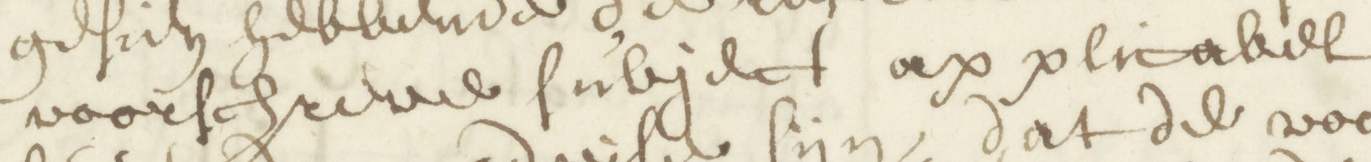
voorschreve subject applicabel
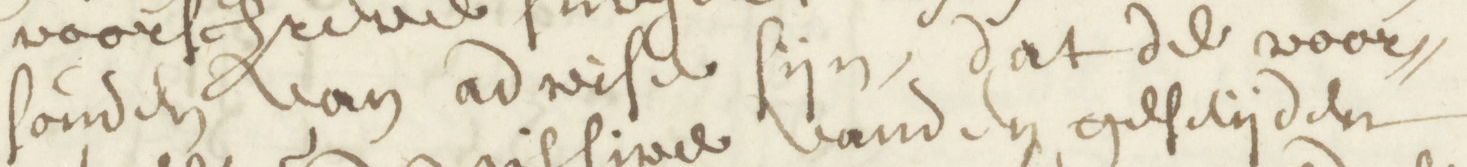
souden van advise sijn, dat de voor„
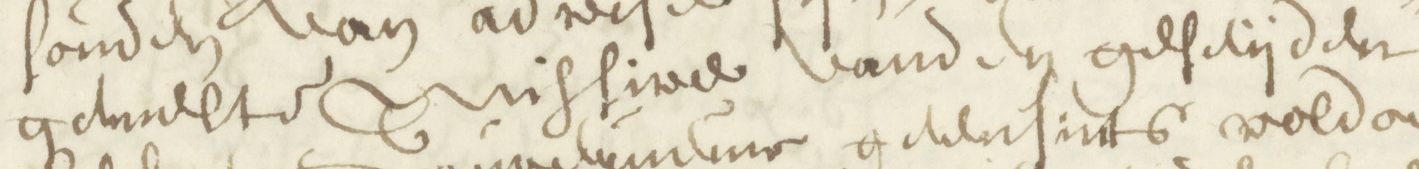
gemelte Missive vanden geschijden
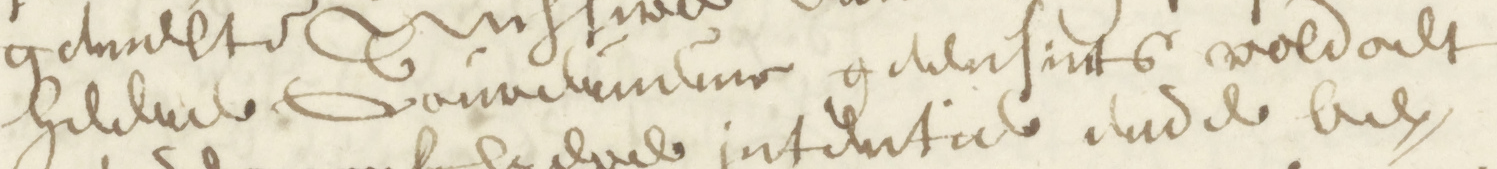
heere Gouverneur geensints voldoet
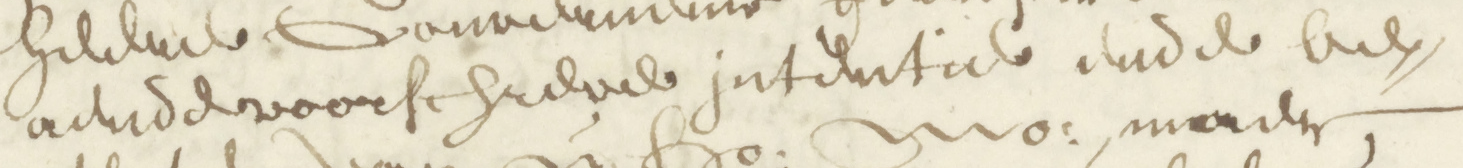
aende voorschreve Intentie ende be„
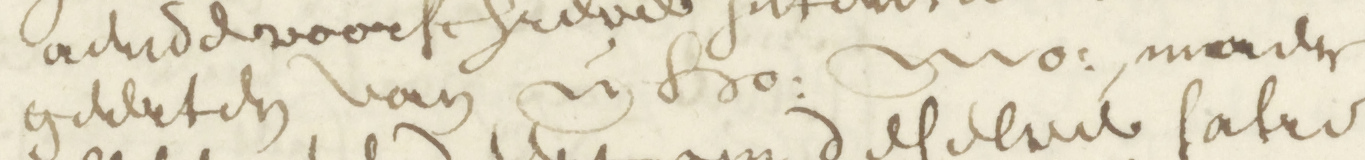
geerten van U Ho:Mo:, maer
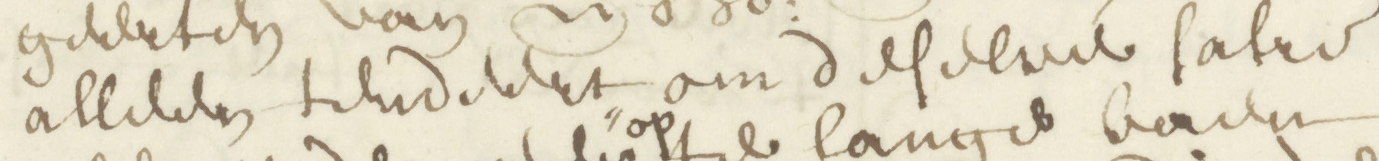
alleen tendeert om deselve sake
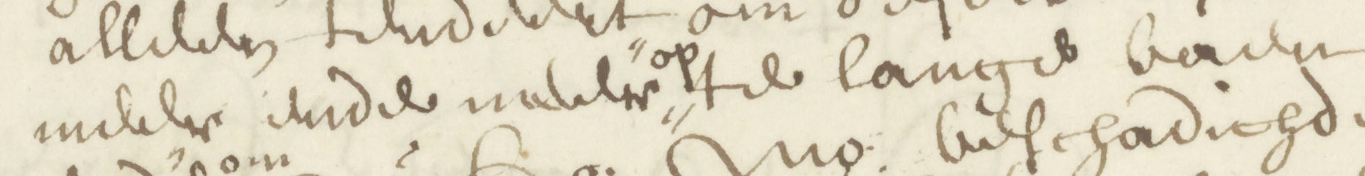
meer ende meer op te lange baen
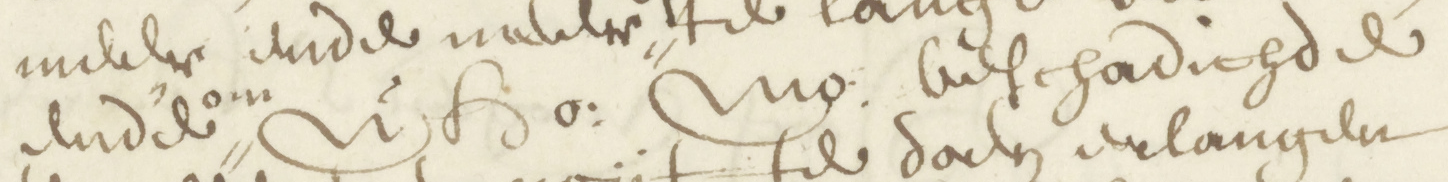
ende om U Ho:Mo: beschadichde
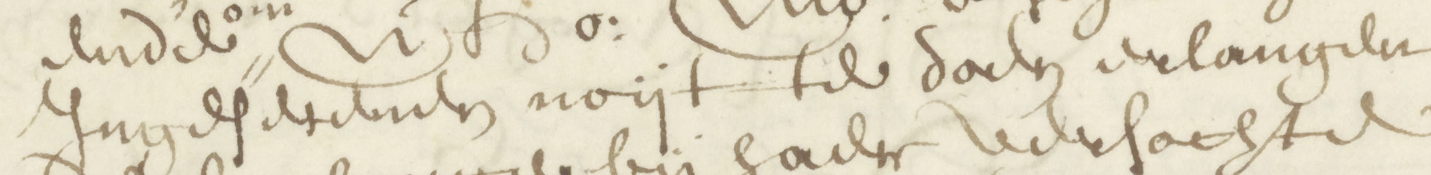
Ingesetenen noijt te doen erlangen
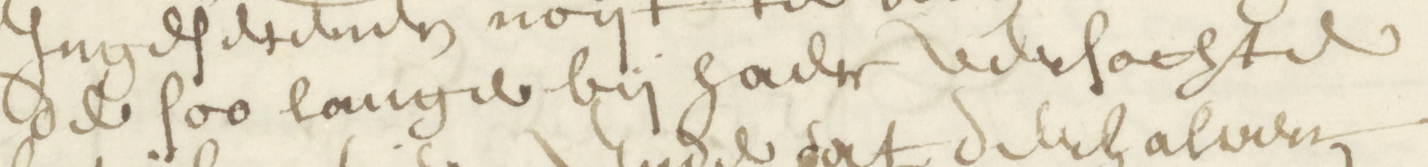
de soo lange bij haer versochte
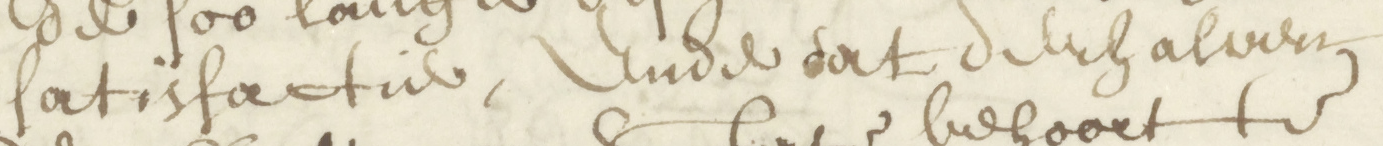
satisfactie. Ende dat derhalven
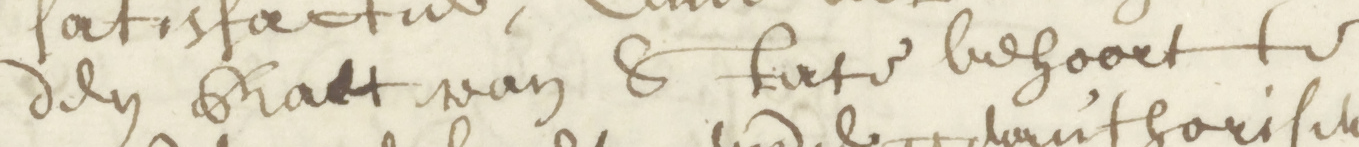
den Raet van State behoort te
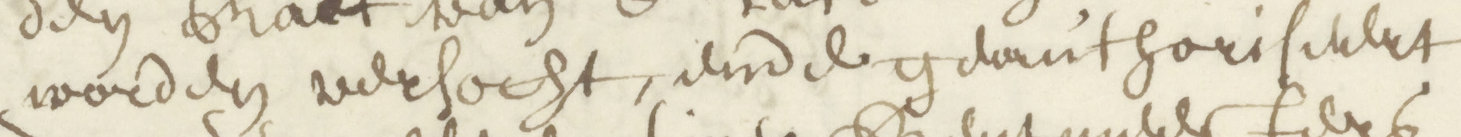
worden versocht, ende geauthoriseert
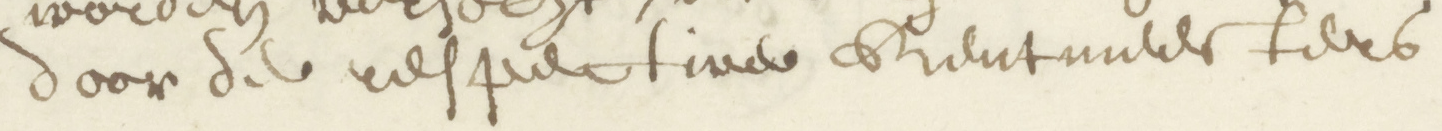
door de respective Rentmeesters
